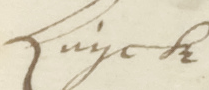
Luijck
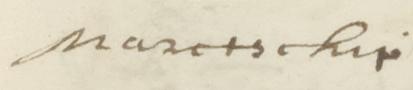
Marctschip.
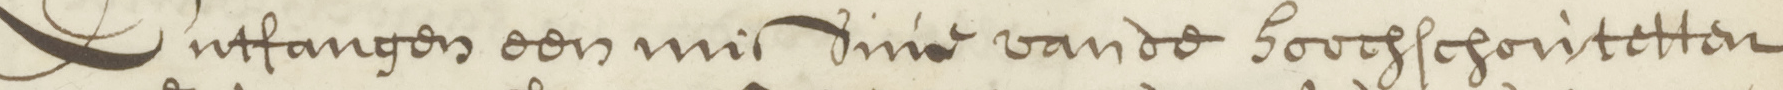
Ontfangen een missiue van de hoochschoutetten
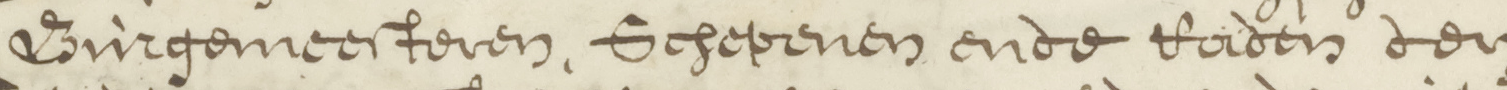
Burgemeesteren, Schepenen ende Raden der
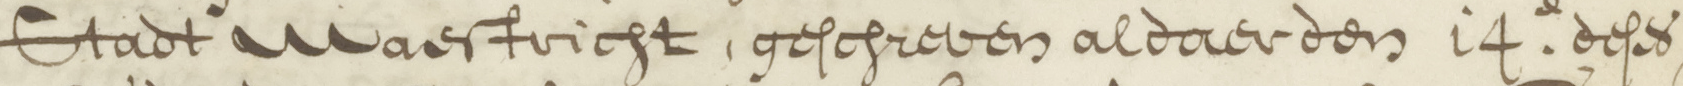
Stadt Maestricht, geschreven aldaer den 14e. deses,
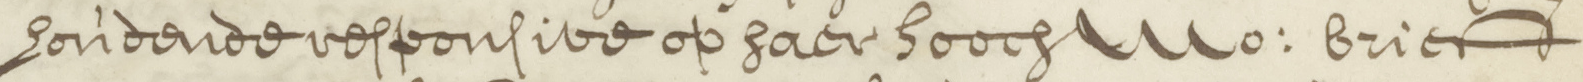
houdende responsive op haer hoochMo: brieff
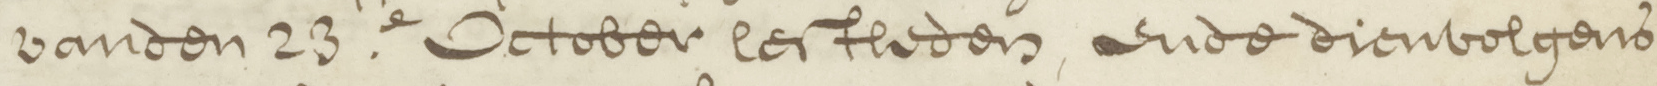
van den 23e. October lestleden, ende dienvolgens
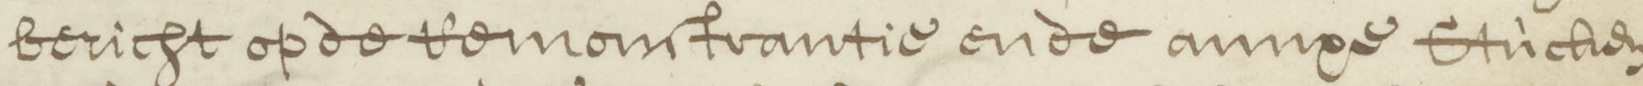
bericht op de Remonstrantie ende annxe Stucken
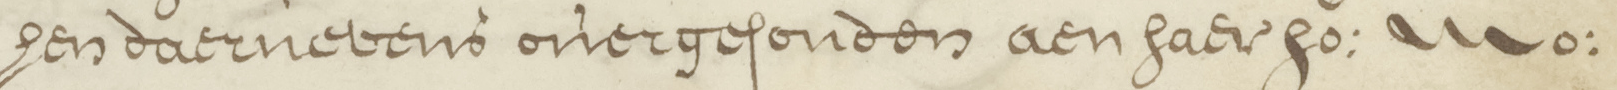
hen daernevens ouergesonden aen haer ho:Mo:
